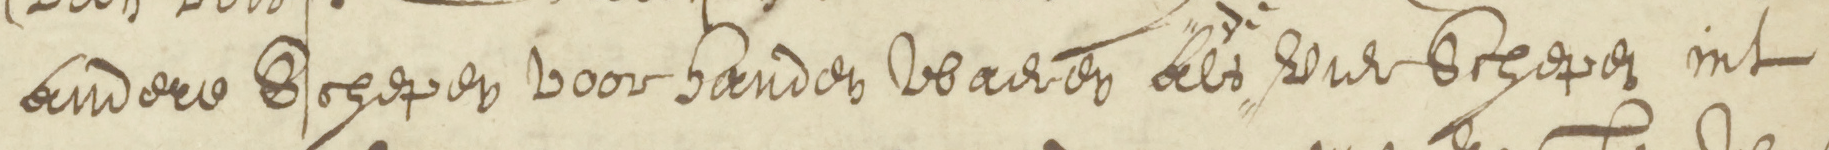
andere Schepen voor handen waeren als,,vier Schepen int
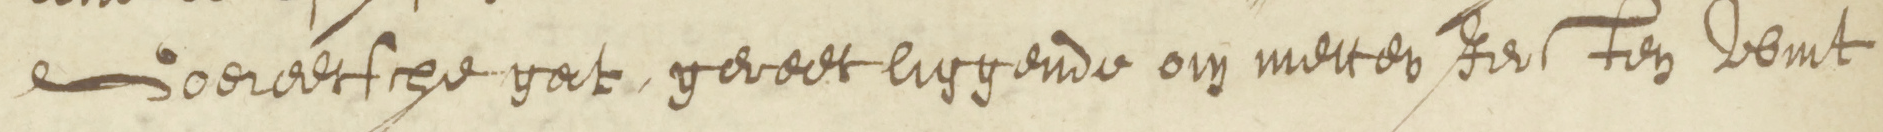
Goereetsche gat, gereet liggende om metten Iersten wint
